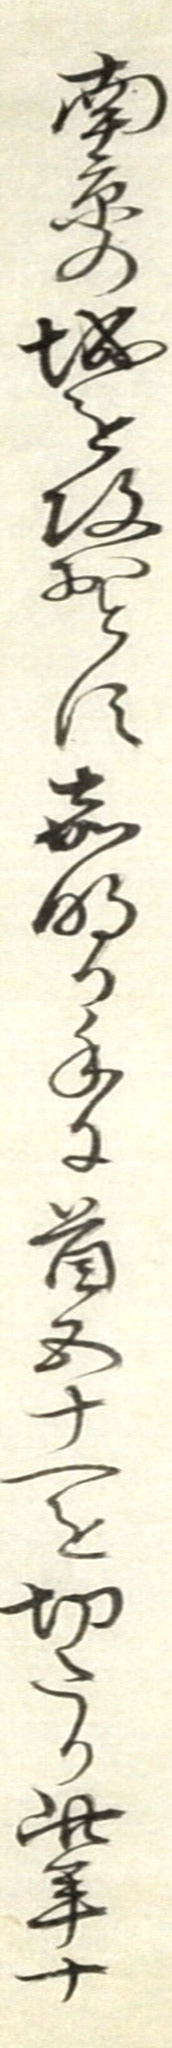南京の城を攻おとす嘉明か手に首五十一を切たり此年十
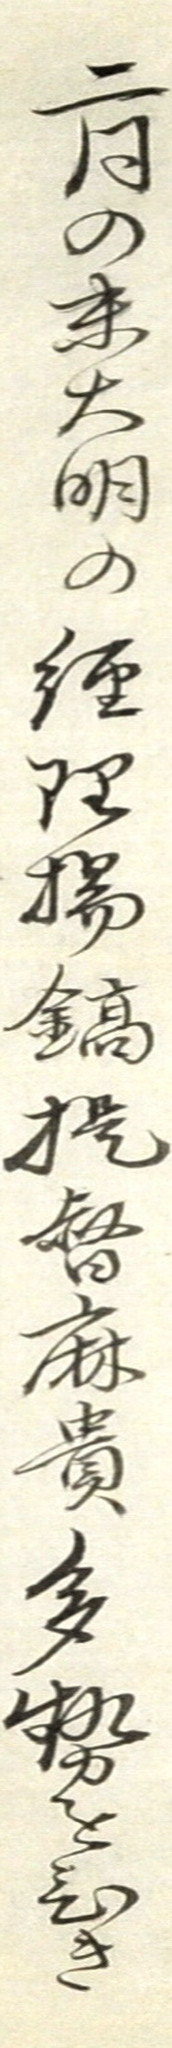二月の末大明の経理楊鎬提督麻貴多勢をひき
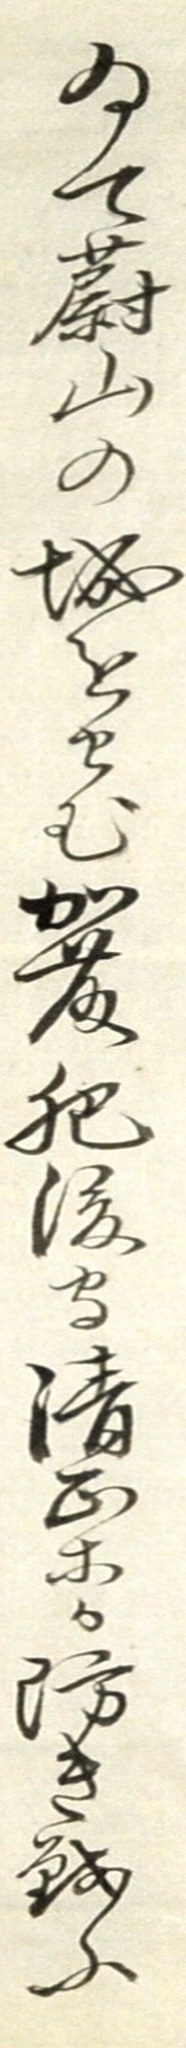ゐて蔚山の城をせむ加藤肥後守清正等か防き戦ふ
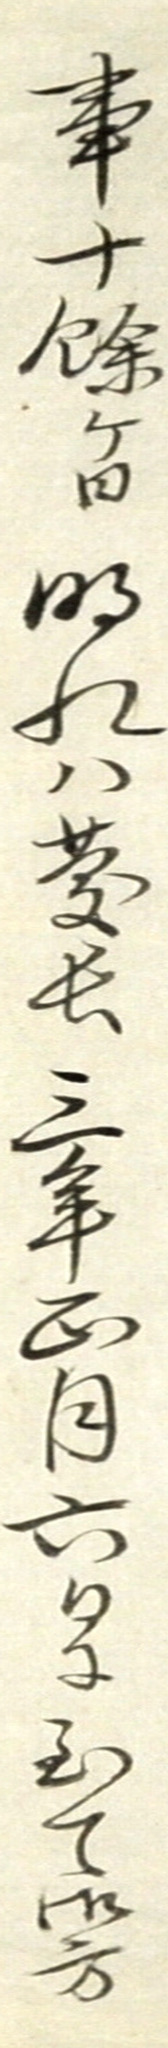事十余ヶ日明れは慶長三年正月六日に至て御方
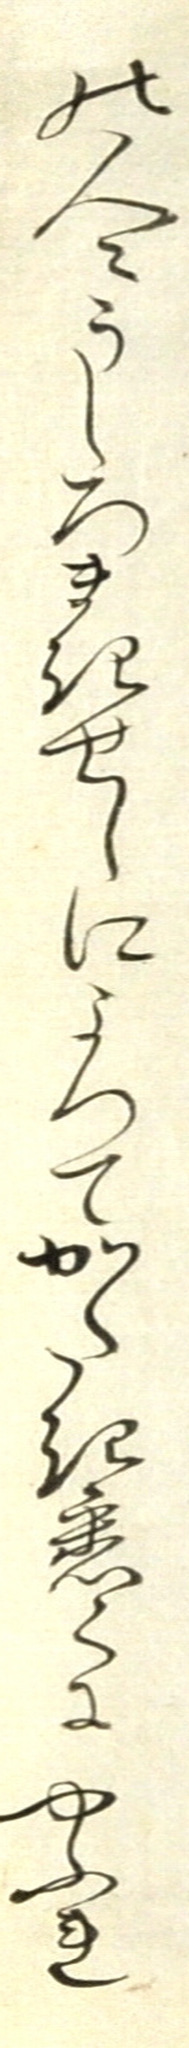の人々うしろまきせしによつてかたき悉くにやふれ

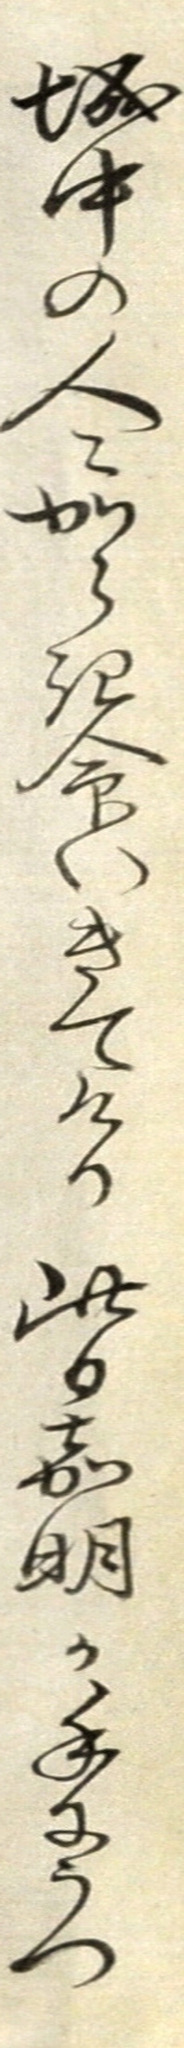城中の人々からき命いきてけり此日嘉明か手にうつ
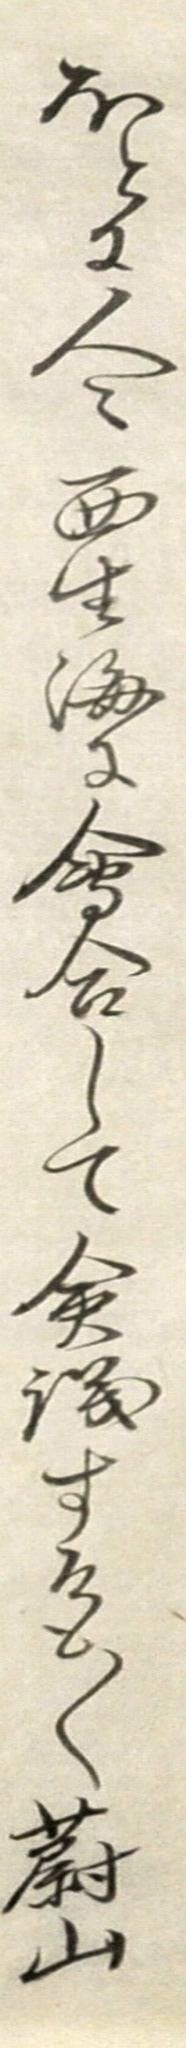ほとに人々西生海に会合して僉議すそも〳〵蔚山
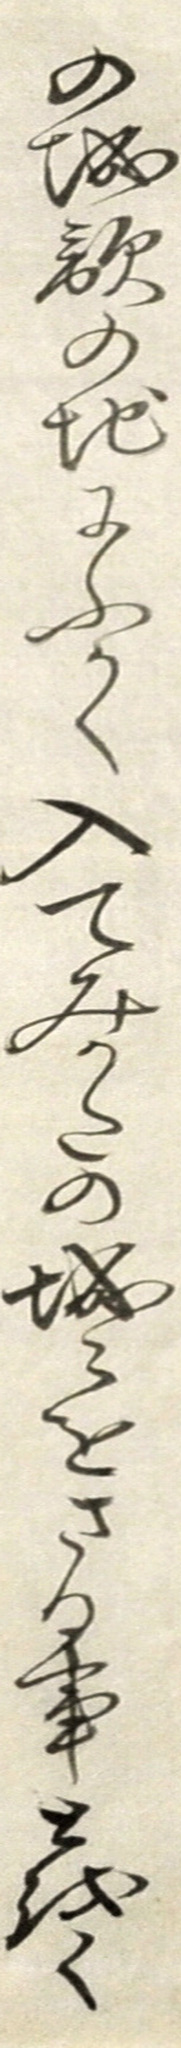の城敵の地にふかく入てみかたの城々をさる事とをく
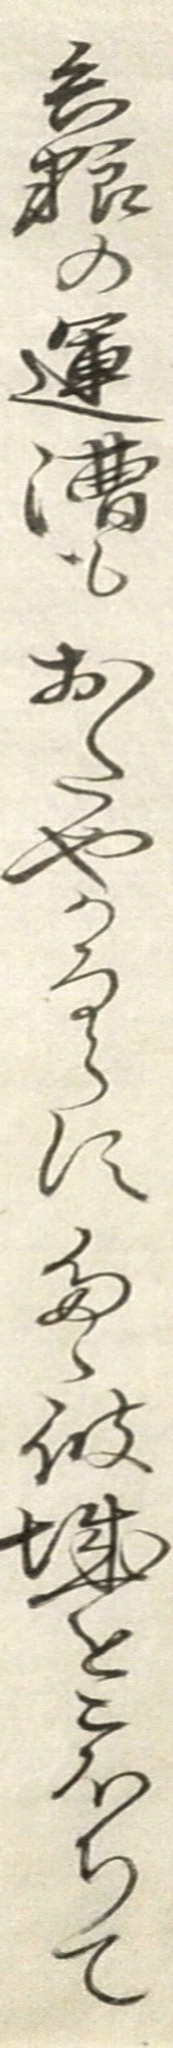兵粮の運漕もおたやかならすたゝ彼城をこほちて
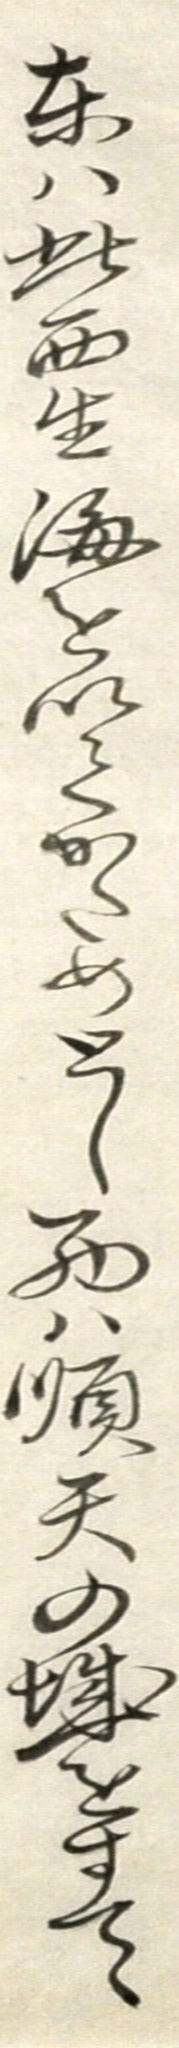東は此西生海を以てかためとし西は順天の城をすてゝ
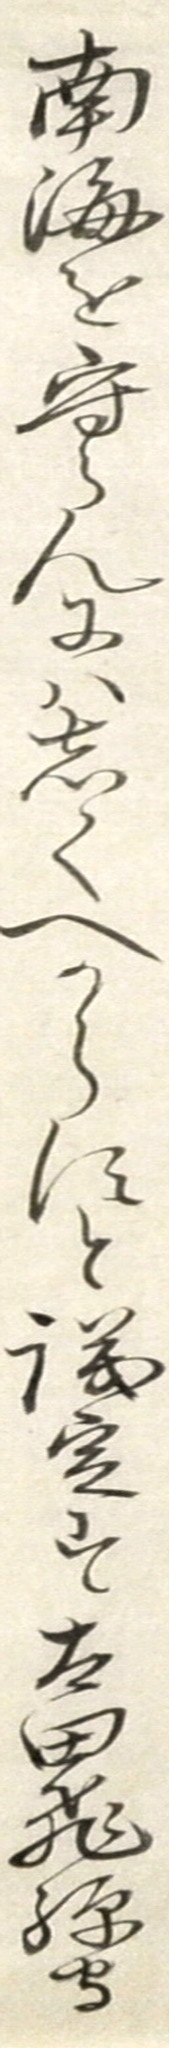南海を守らんにはしくへからすと議定す太田飛騨守
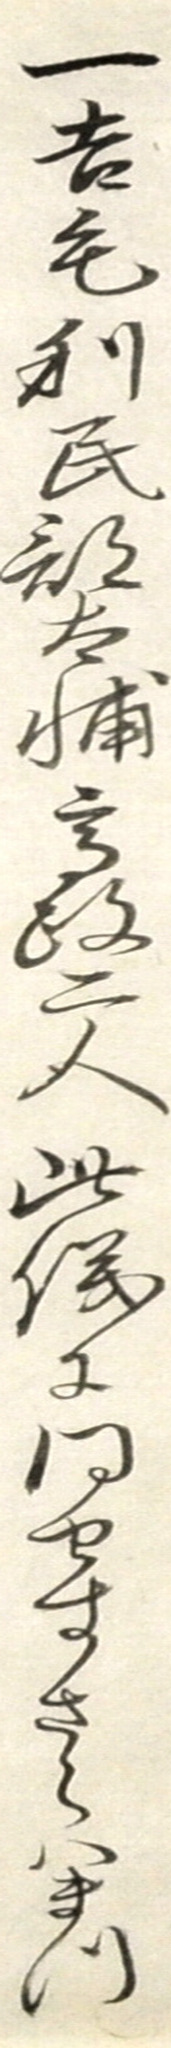一吉毛利民部太輔高政二人此義に同せすさらはまつ
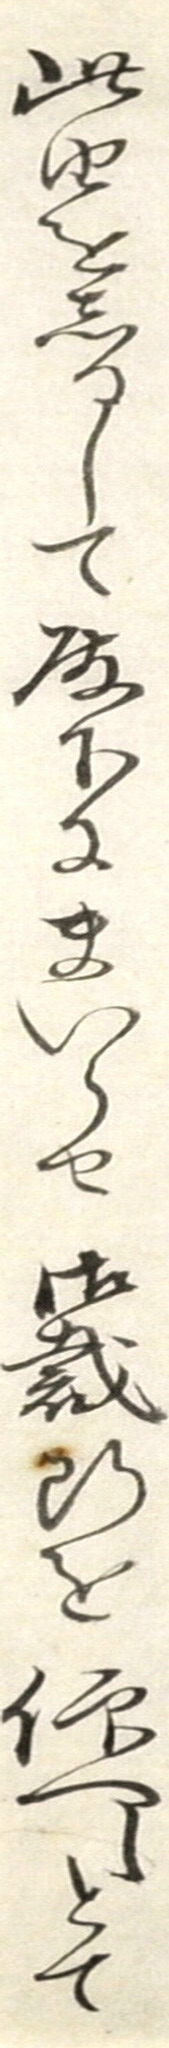此由をしるして殿下にまいらせ御裁断を仰へしとて
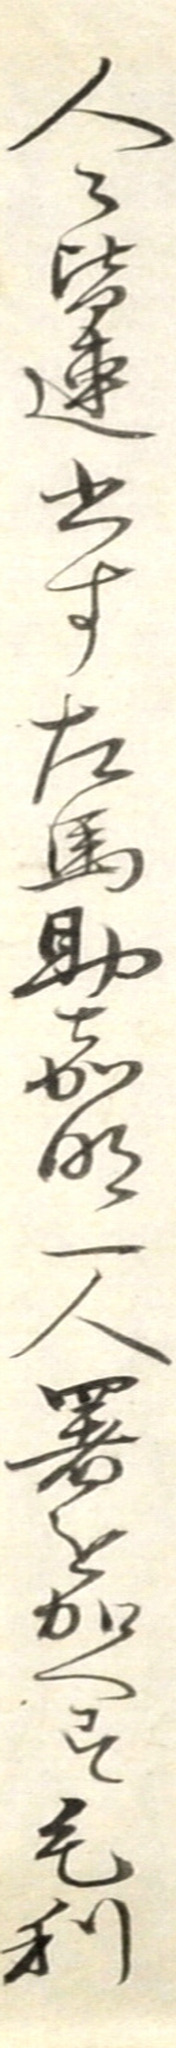人々皆連書す左馬助嘉明一人署を加へす毛利
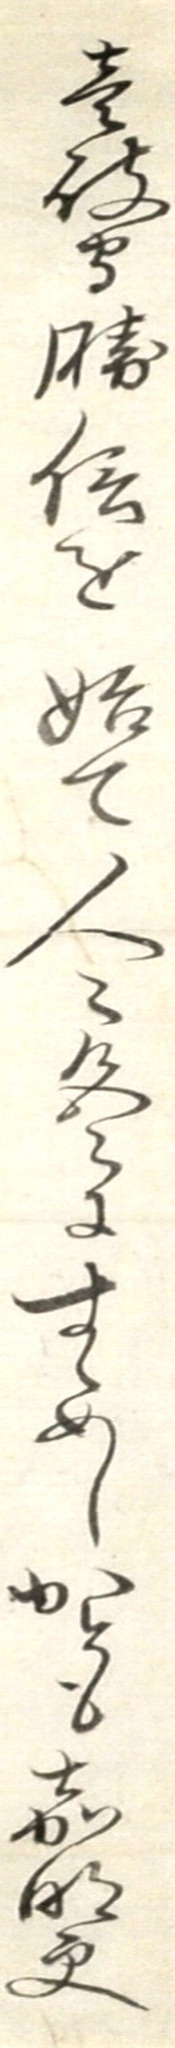壱岐守勝信を始て人々色々にすゝめしかとも嘉明更
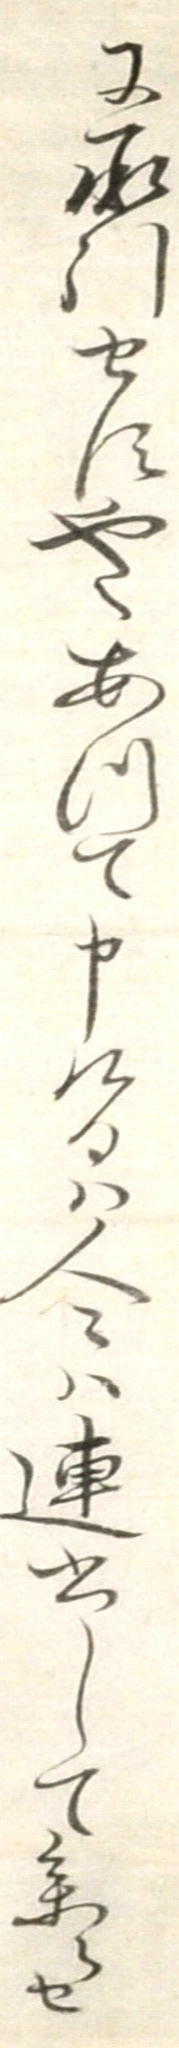に承引せすやゝあつて申けるは人々は連書して参らせ
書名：藩翰譜（七・下）
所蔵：伊那市立高遠町図書館・合同会社AMANE
